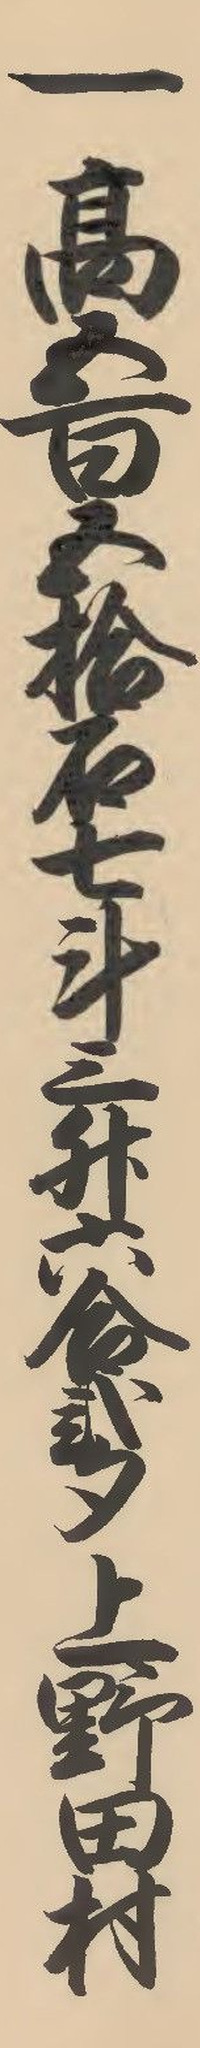一髙五百五拾石七斗三升六合弐夕上野田村
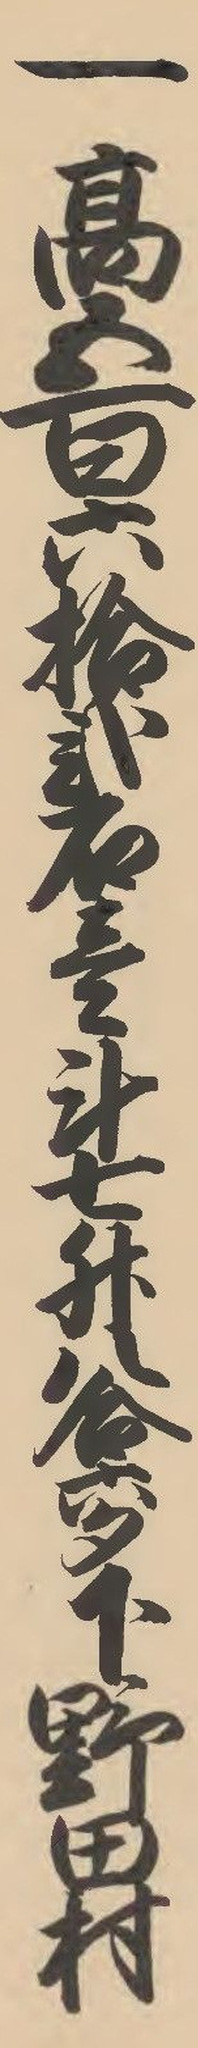一髙五百六拾弐石壱斗七升八合六夕下野田村
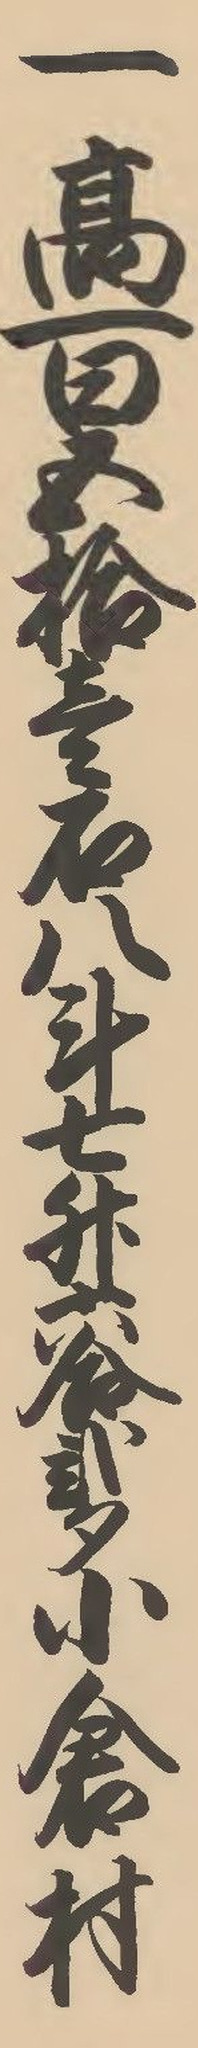一髙百五拾壱石八斗七升六合弐夕小倉村

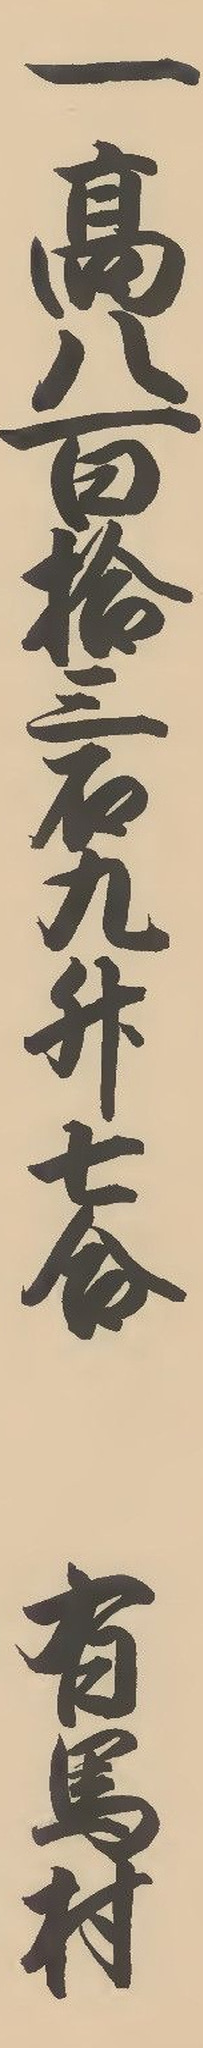一髙八百拾三石九斗七合有馬村
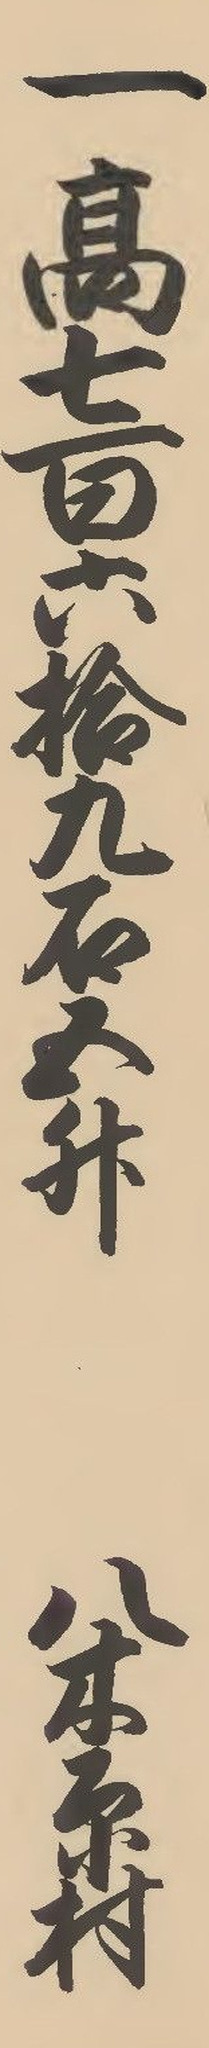一髙七百六拾九石五升八木原村
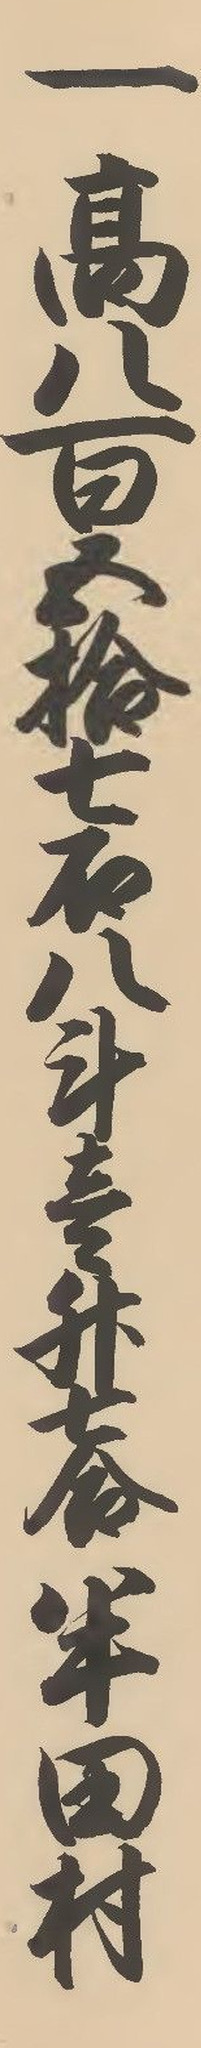一髙八百五拾七石八斗壱升七合半田村
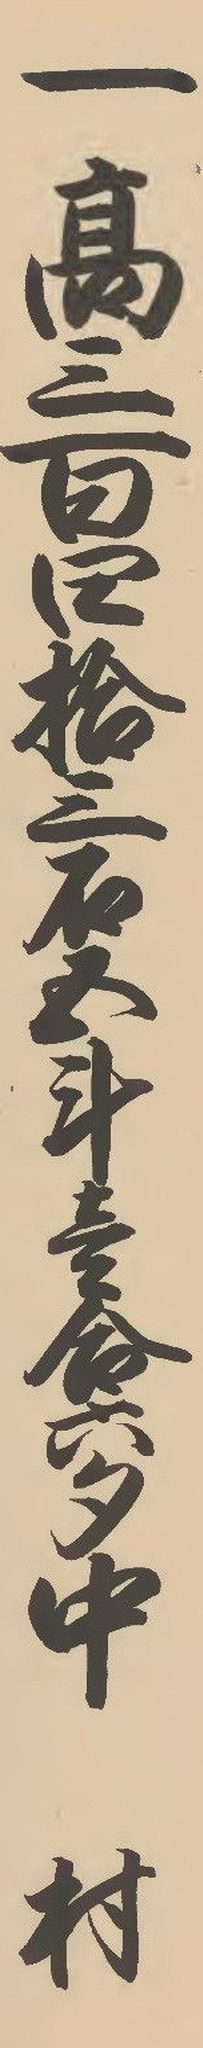一髙三百四拾三石五斗壱合六夕中村
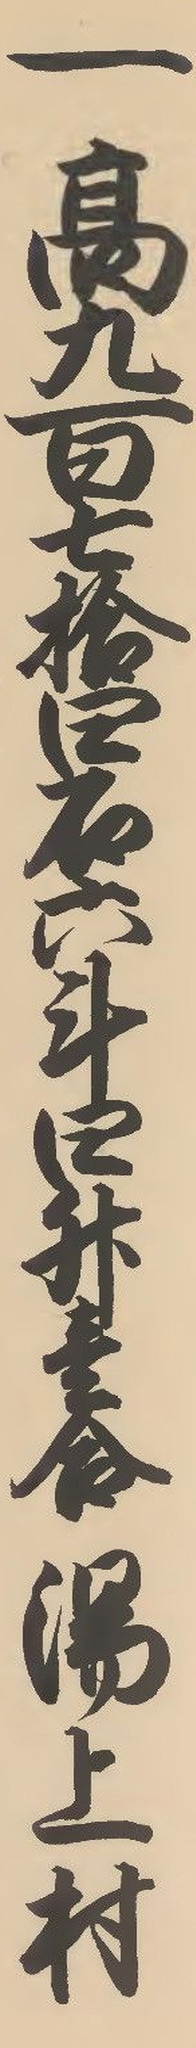一髙九百七拾四石六斗四升壱合湯上村
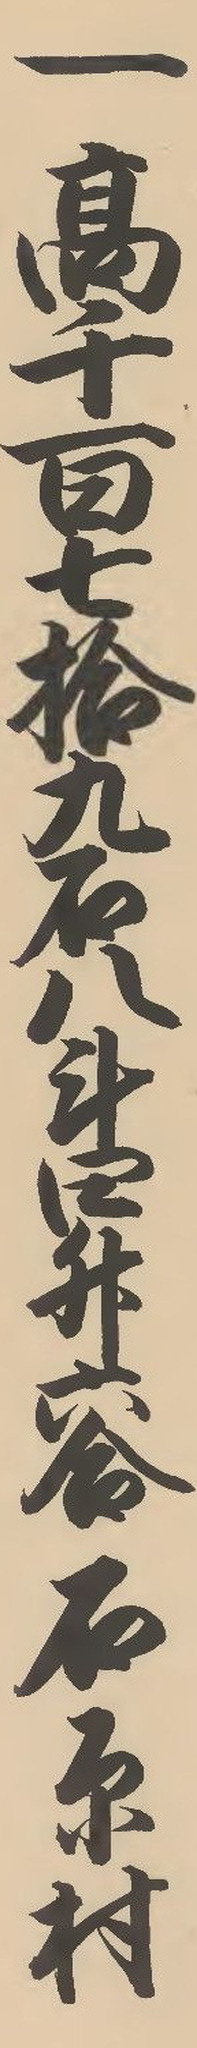一髙千百七拾九石八斗四升六合石原村
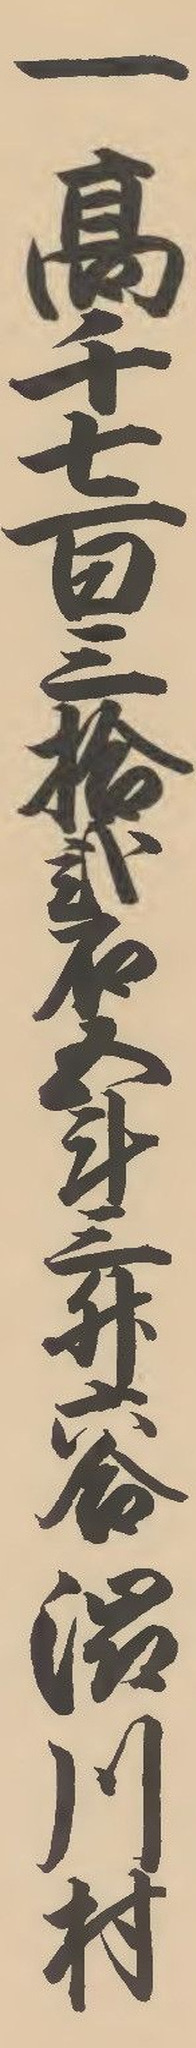一髙千七百三拾弐石五斗三升六合川村
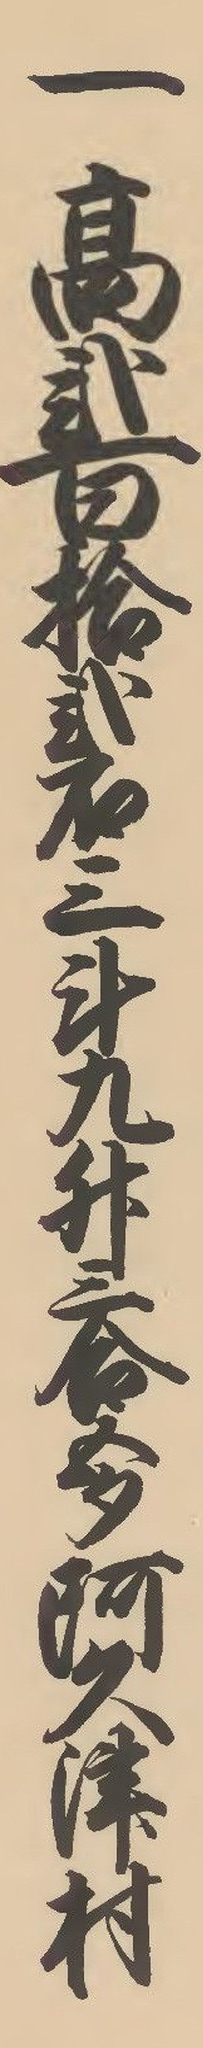一髙弐百拾弐石三斗九升三合五夕阿久津村

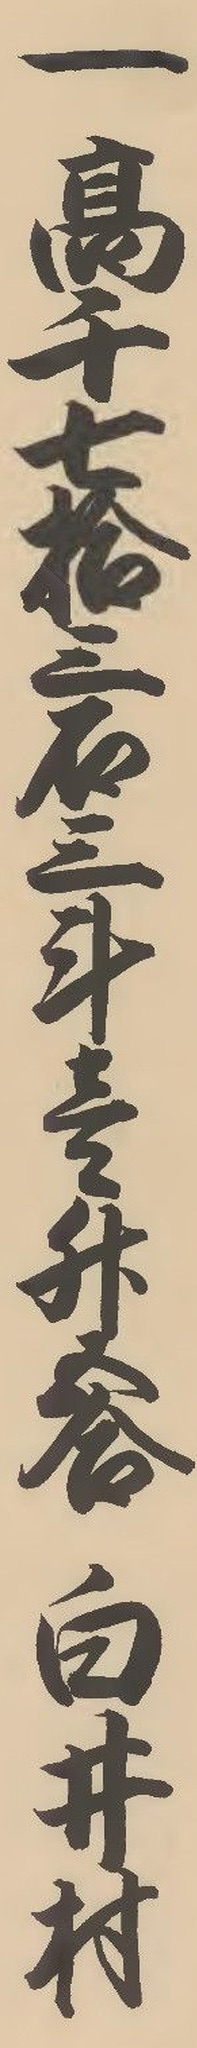一髙千七拾三石三斗壱升五合白井村
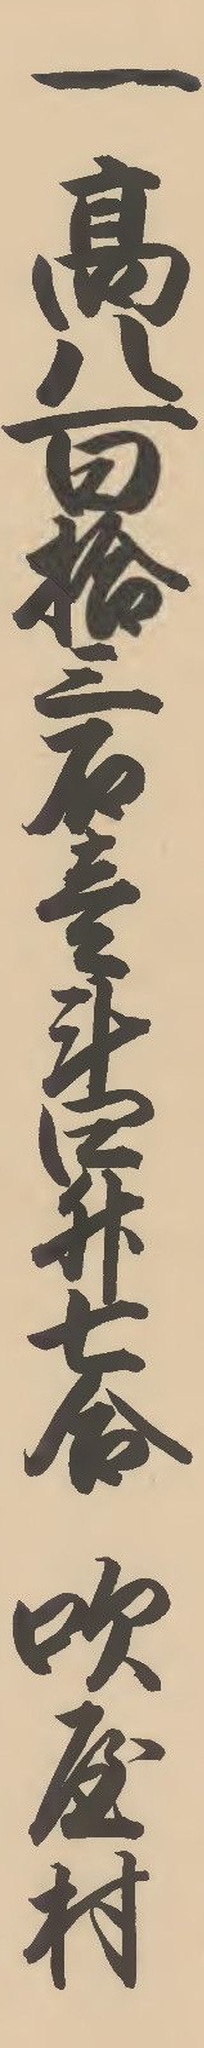一髙八百拾三石壱斗四升七合吹屋村
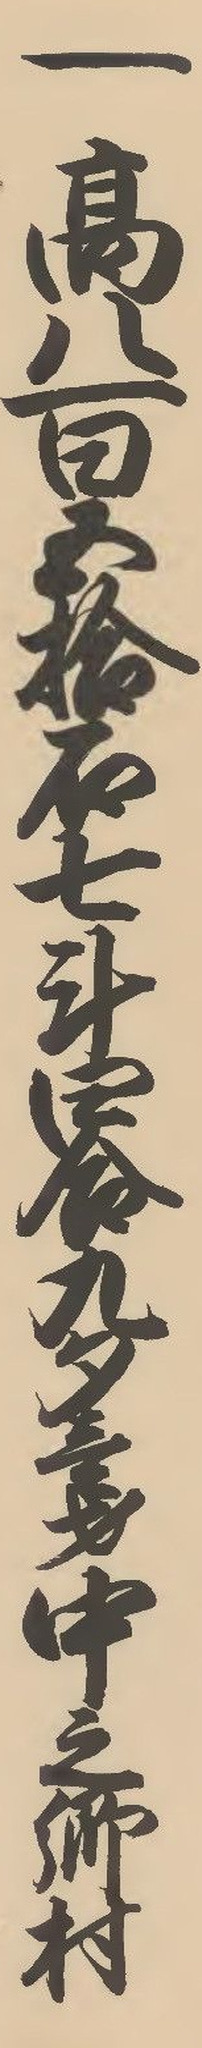一髙八百五拾石七斗四合九夕壱才中之郷村
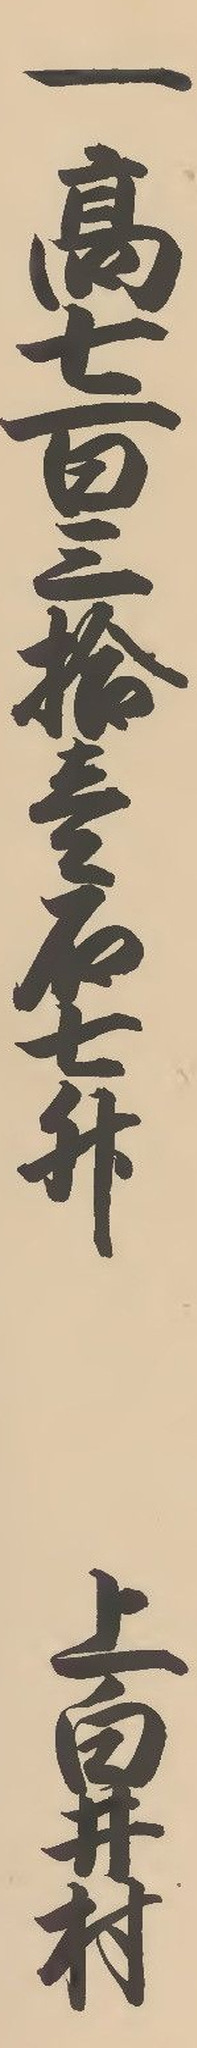一髙七百三拾壱石七升上白井村
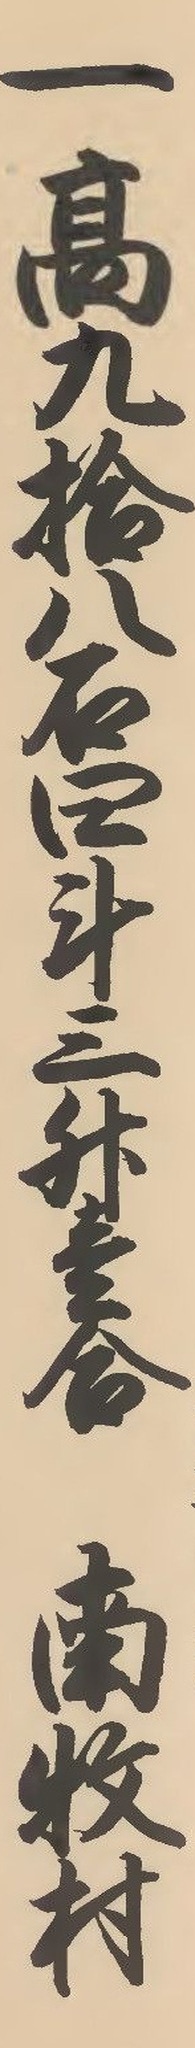一髙九拾八石四斗三升壱合南牧村
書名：上野国郷帳
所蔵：国立公文書館 National Archives of Japan
